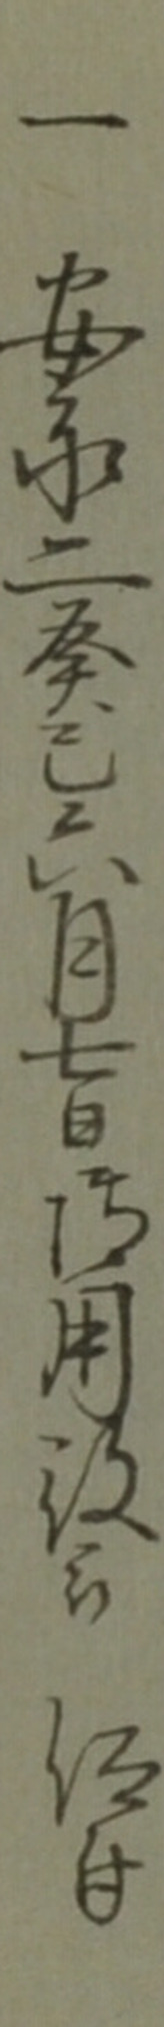一安永二癸巳六月七日御用役被仰付
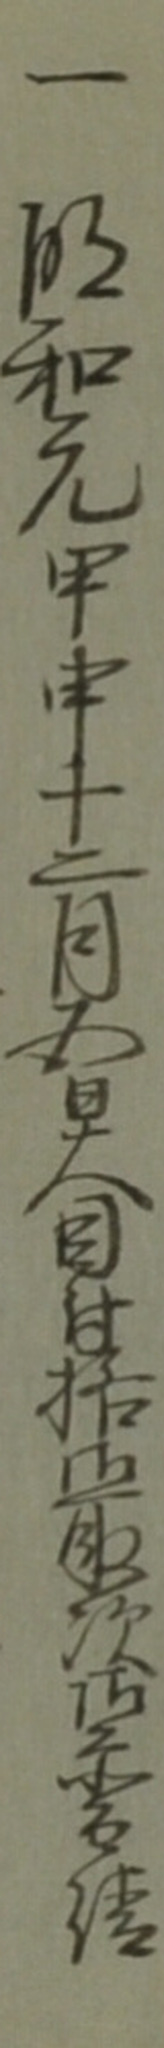一明和元甲申十二月五日大目付格御取次御普請
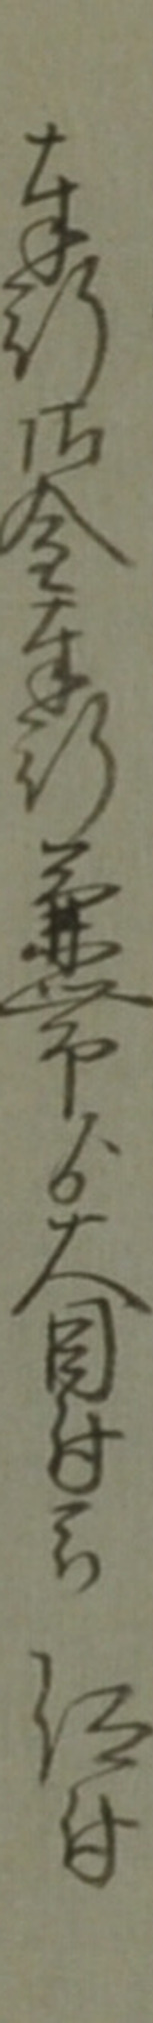奉行御金奉行兼帯ゟ大目付被仰付
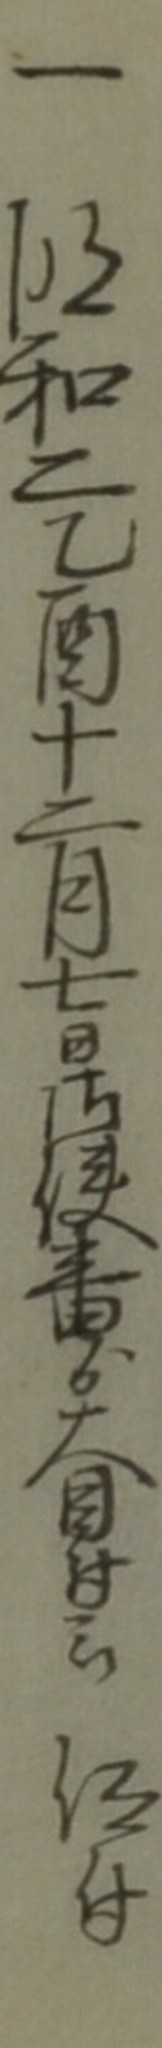一明和二乙酉十二月七日御使番ゟ大目付被仰付
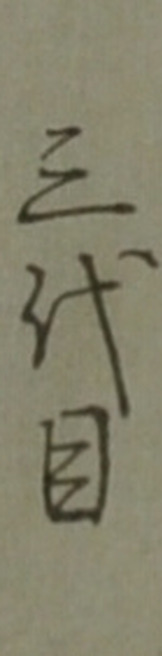三代目
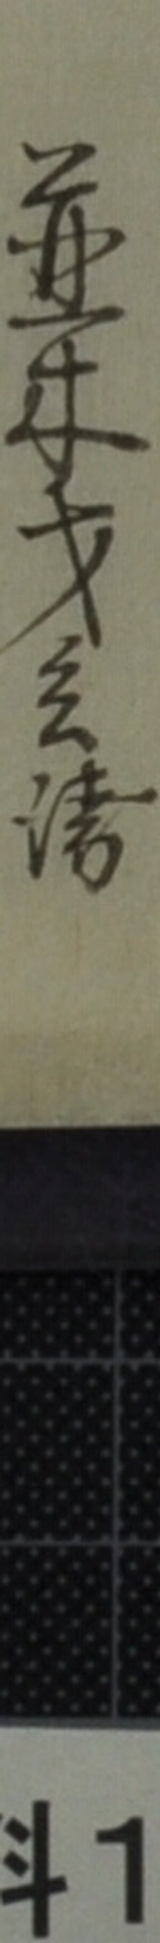並木才兵衛
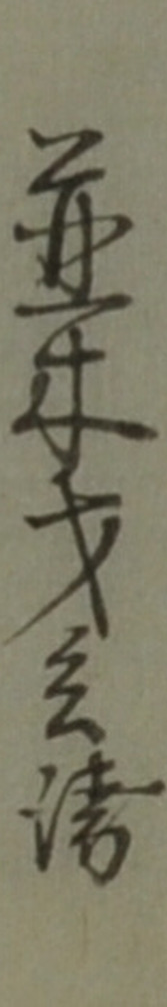並木才兵衛
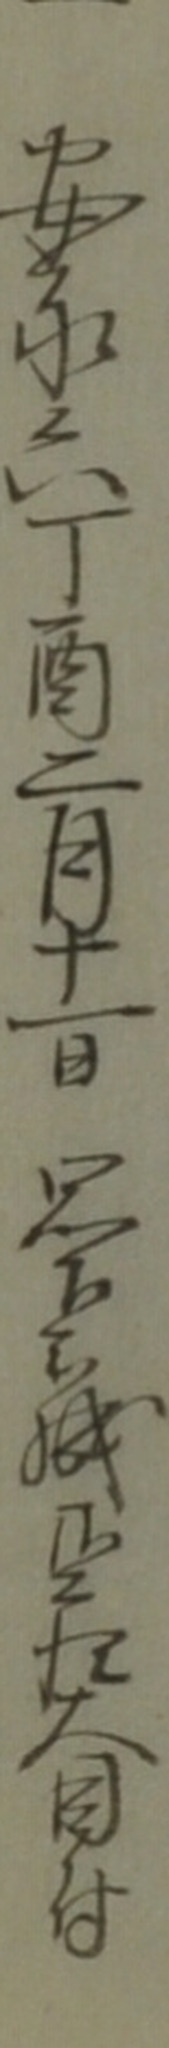一安永六丁酉二月十一日思召被成御座大目付
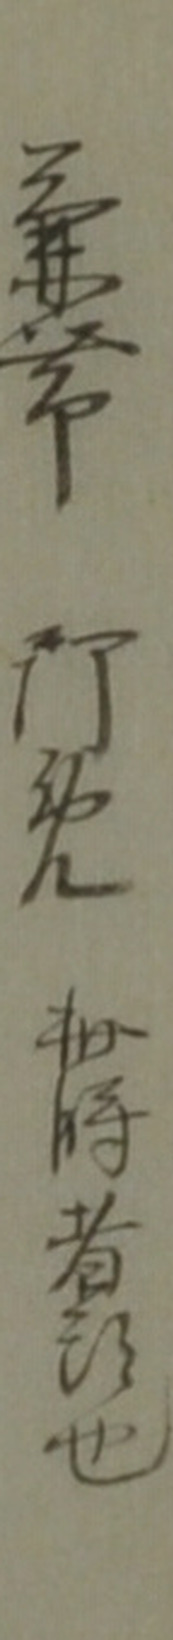兼帯御免此時者頭也
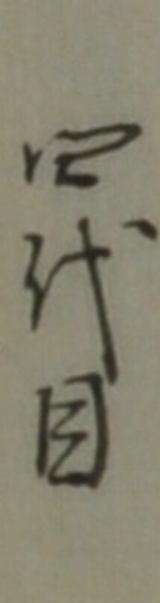四代目
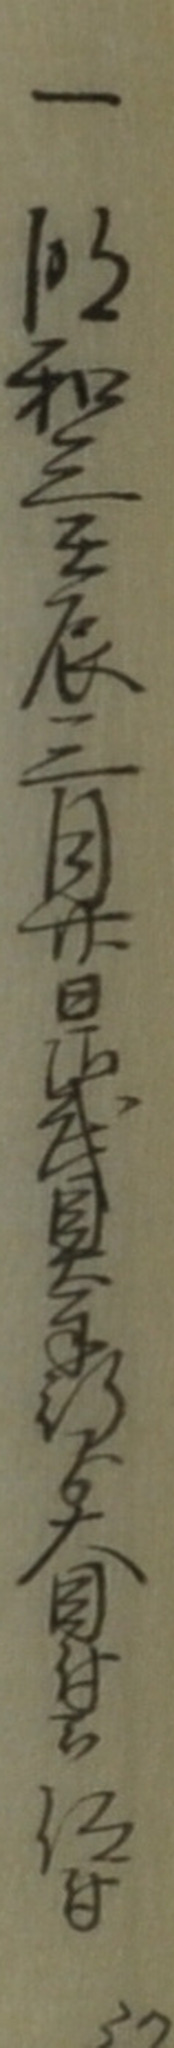一明和三壬辰三月廿日御武具奉行ゟ大目付被仰付
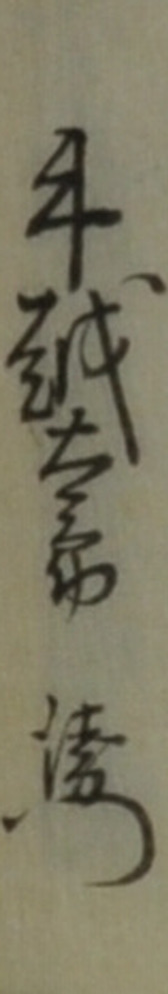牛越太郎衞門
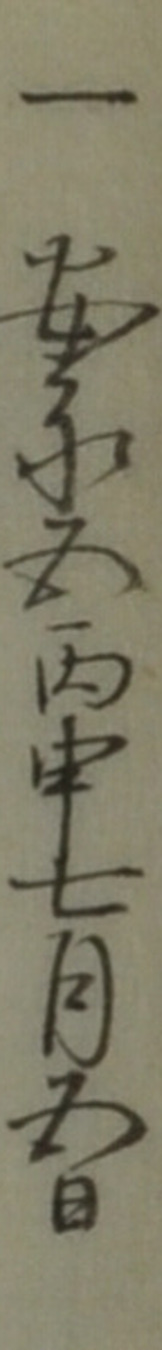一安永五丙申七月五日
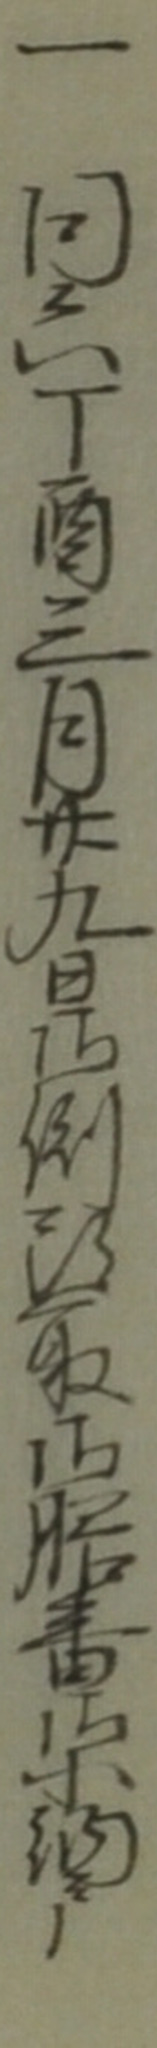一同六丁酉三月廿九日御側頭取御膳番御小納戸
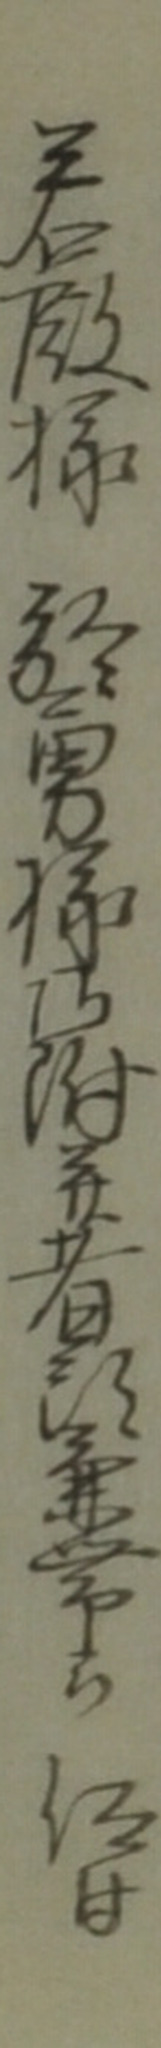若殿様於勇様御附并者頭兼帯被仰付
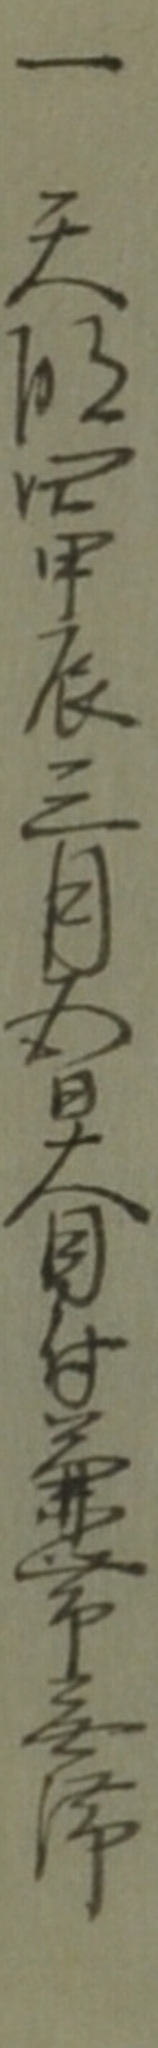一天明四甲辰三月五日大目付兼帯無滞
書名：諸御役代々録（三）
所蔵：伊那市立高遠町図書館・合同会社AMANE
